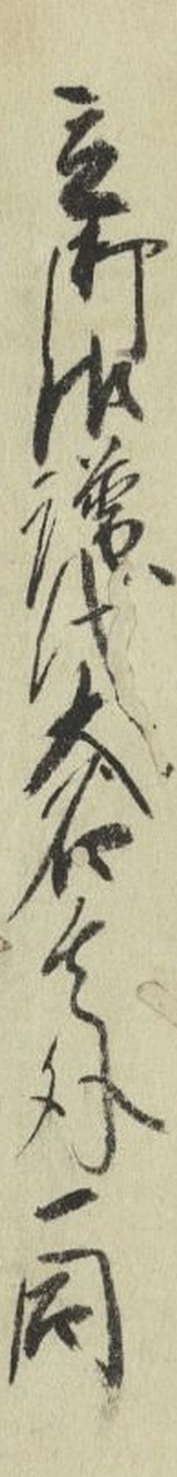立御御譜代大名其外一同
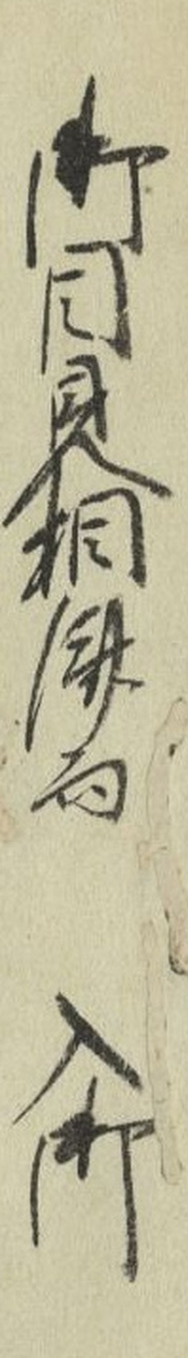御目見相済而入御

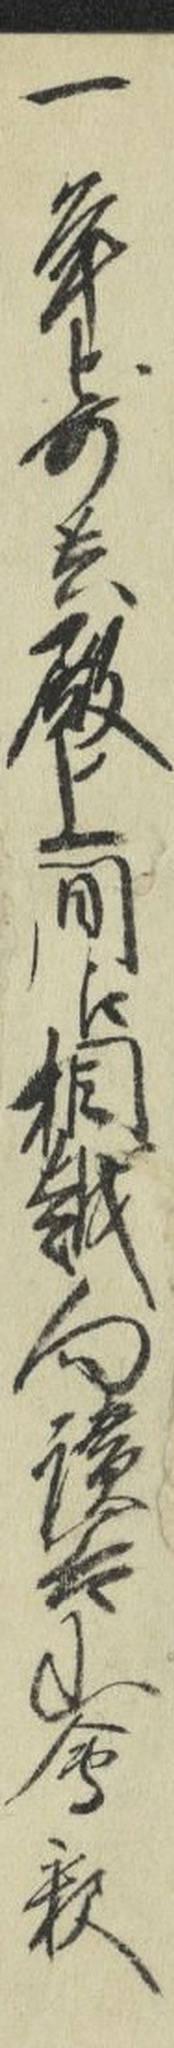一年寄共殿上間え相越向読谷山会釈
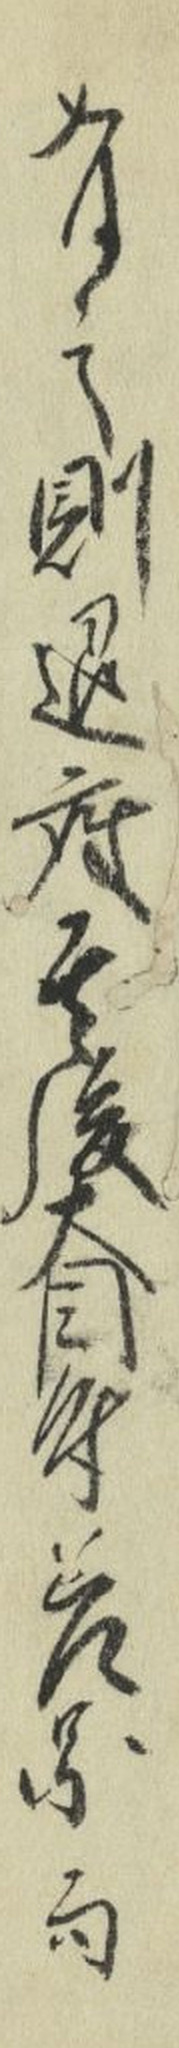有之則退座其後大目付指図而
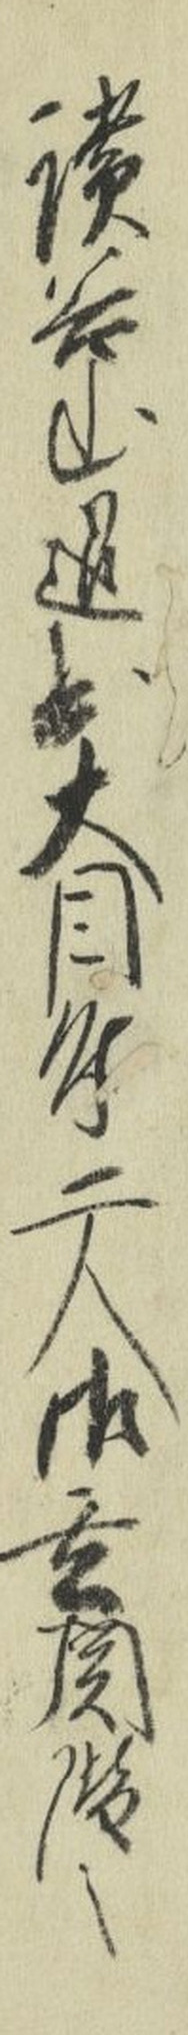読谷山退出大目付二人御玄関階之
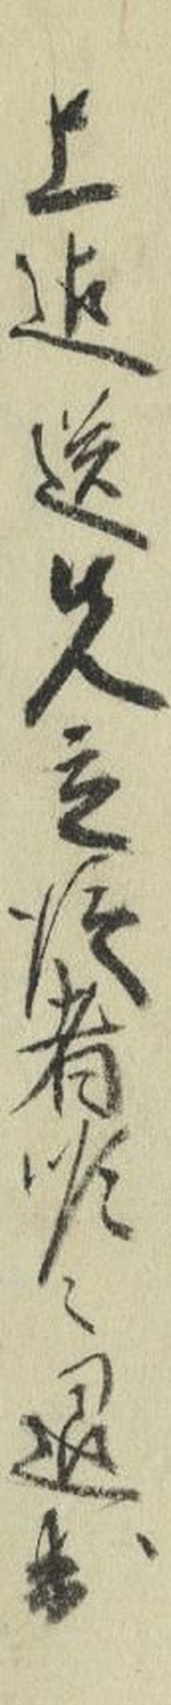上迄送先立従者順々退出
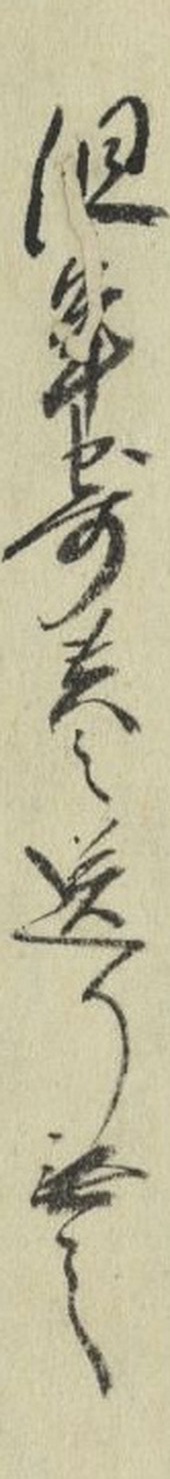但年寄共之送り無之
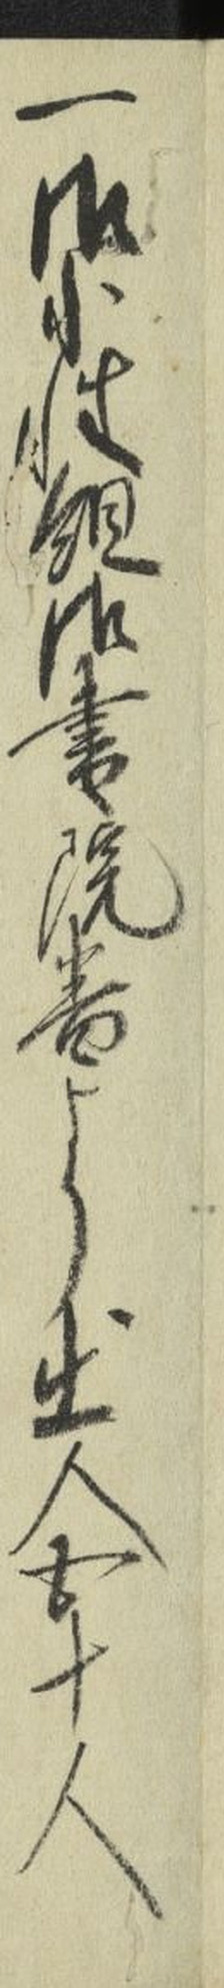一御小性頭御書院番より出人五十人
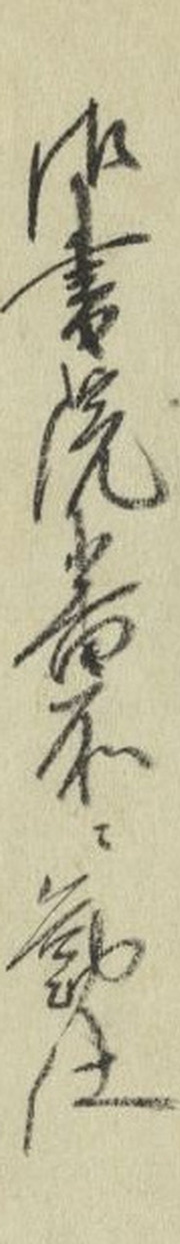御書院番所に勤仕
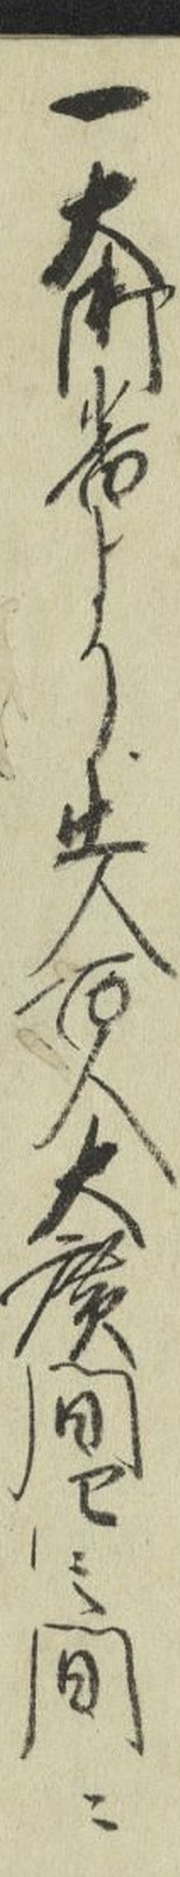一大御番より出人百人大広間四之間に
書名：琉球人御礼の次第
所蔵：University of the Ryukyus Library
